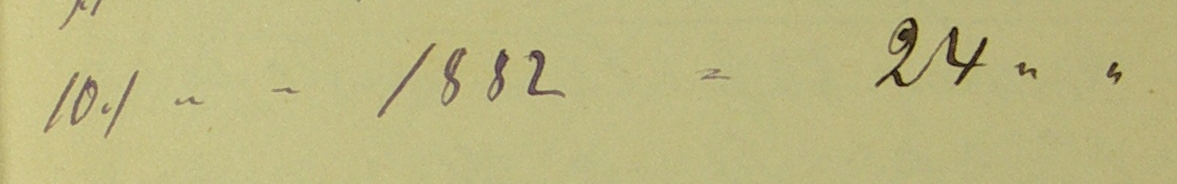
10.) 1882 = 24 *
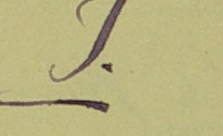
T
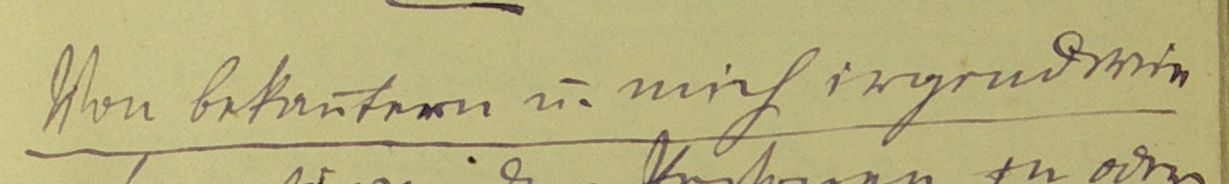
Von bekannteren und mich irgendwie
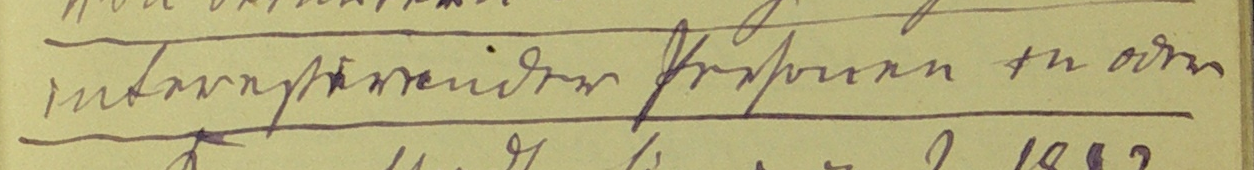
intereßirenden Personen in oder
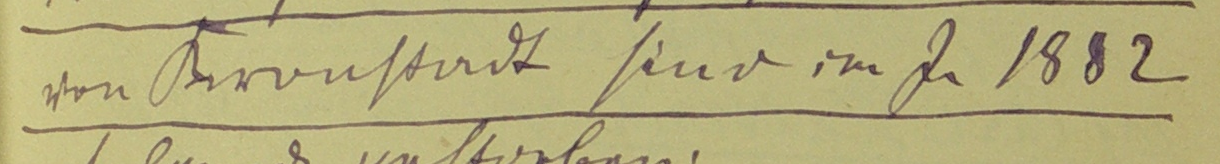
von Kronstadt sind im Jahre 1882
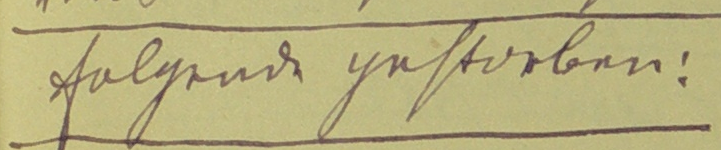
fogende gestorben:
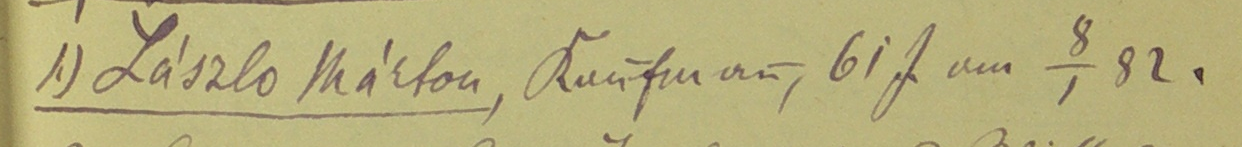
1.) Laszlo Marton, Kaufmann 61 J. am 8/1 82
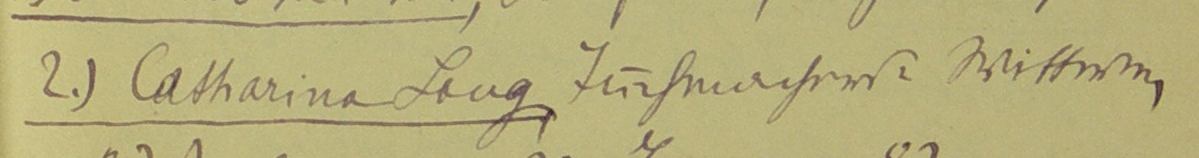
2.) Catherina Lang, Tuchmacher Witwe
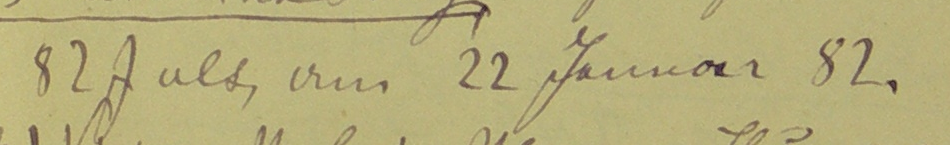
82 J. am 22. Januar 82
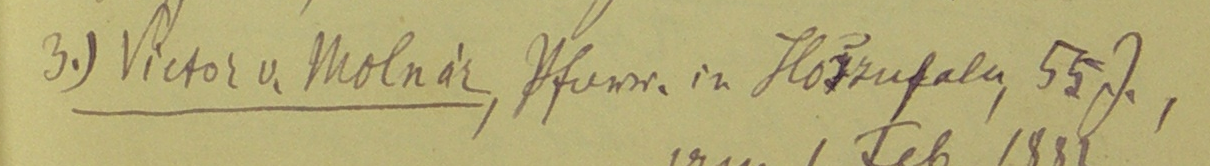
3.) Victor von Molnar, Pfarrer in Hoszufallu, 55 J.
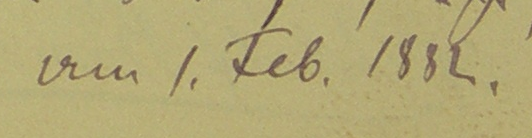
am 1. Febr. 82
